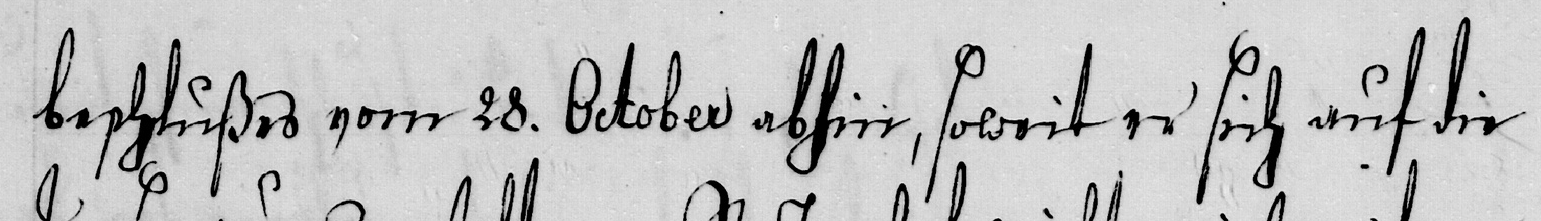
beschlußes vom 28. October abhin, soweit er sich auf die
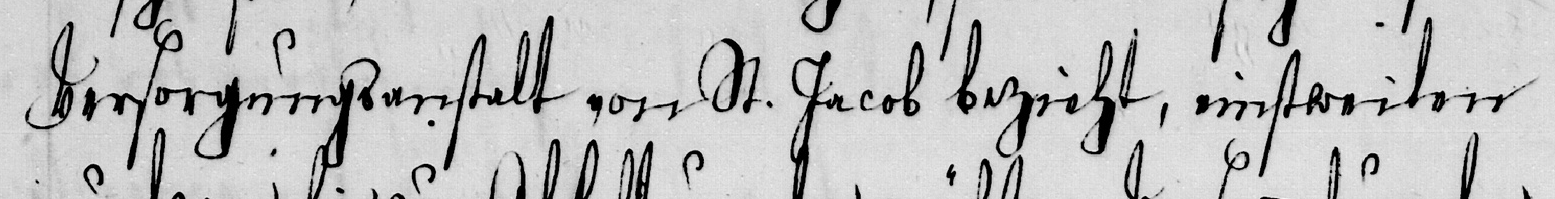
Versorgungsanstalt von St. Jacob bezieht, einstweilen
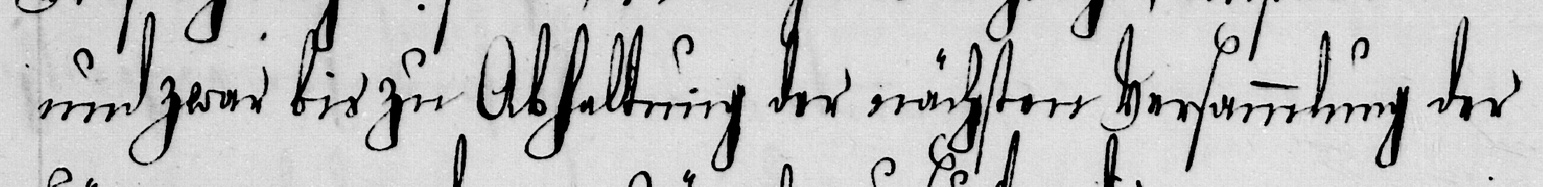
und zwar bis zu Abhaltung der nächsten Versammlung der
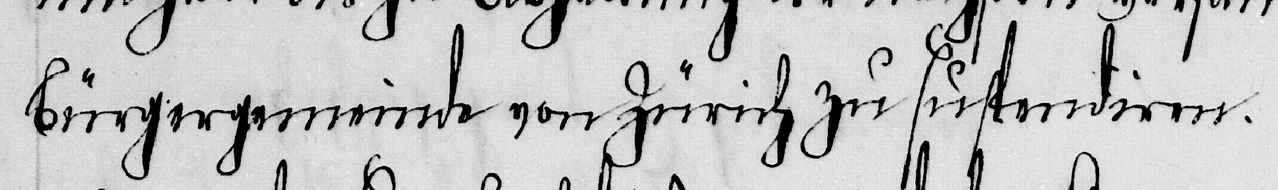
Bürgergemeinde von Zürich zu suspendiren.
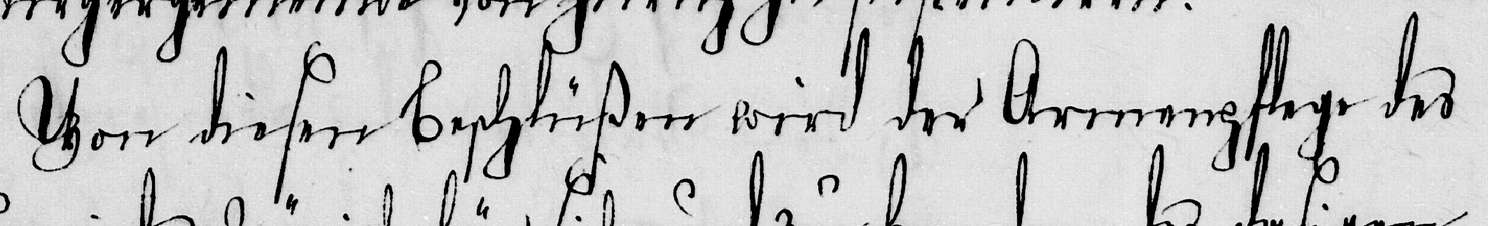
Von diesen Beschlüßen wird der Armenpflege des
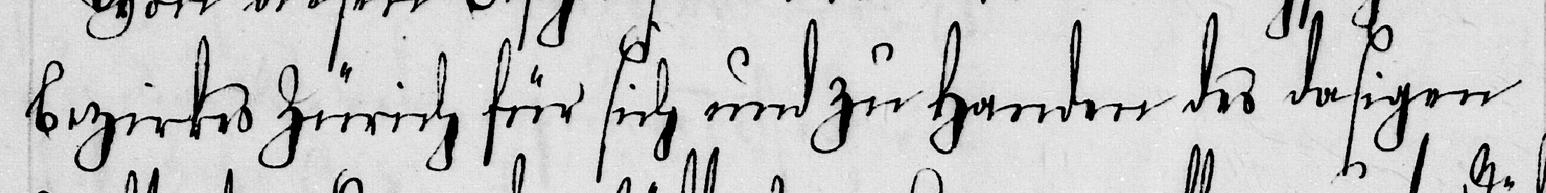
Bezirks Zürich für sich und zu Handen des dasigen
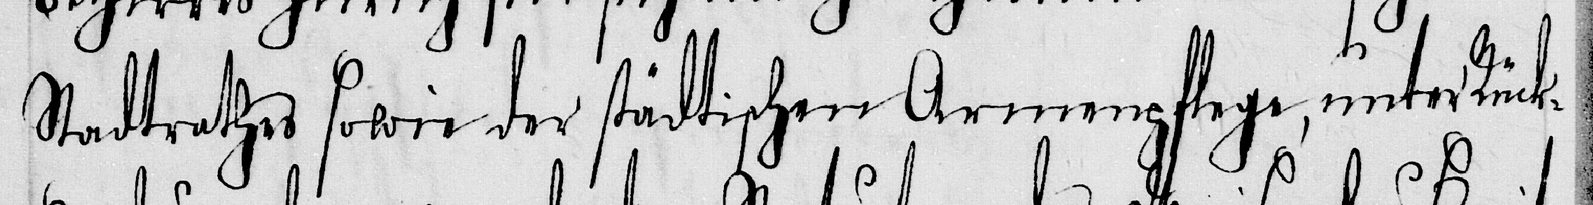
Stadtrathes sowie der städtischen Armenpflege, unter Rück¬
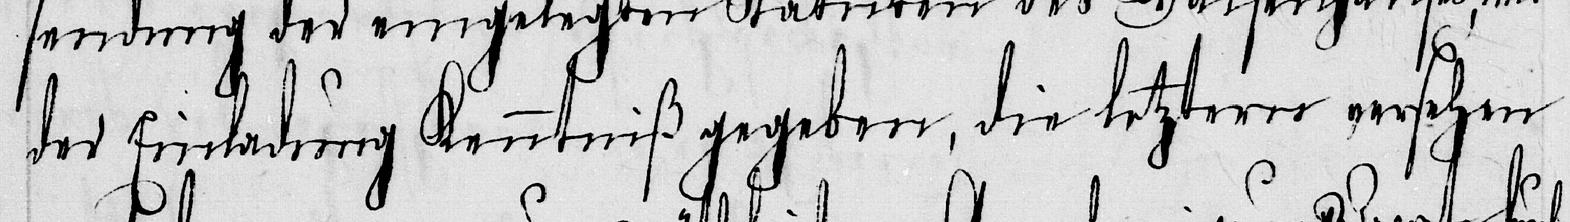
der Einladung Kenntniß gegeben, die letztern versehen
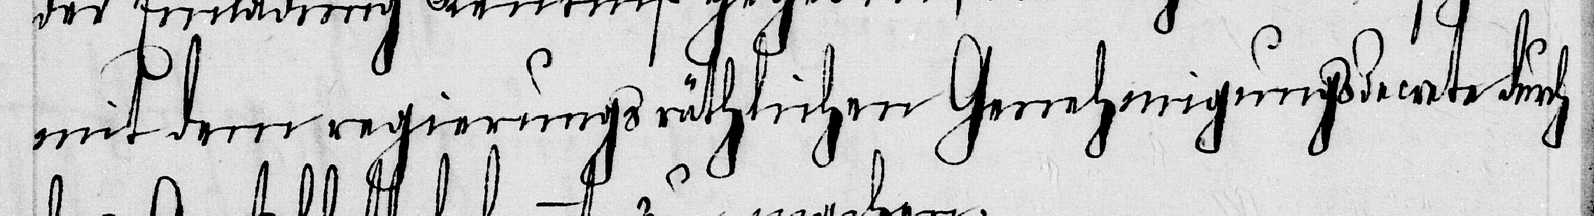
mit dem regierungsräthlichen Genehmigungsdecrete durch
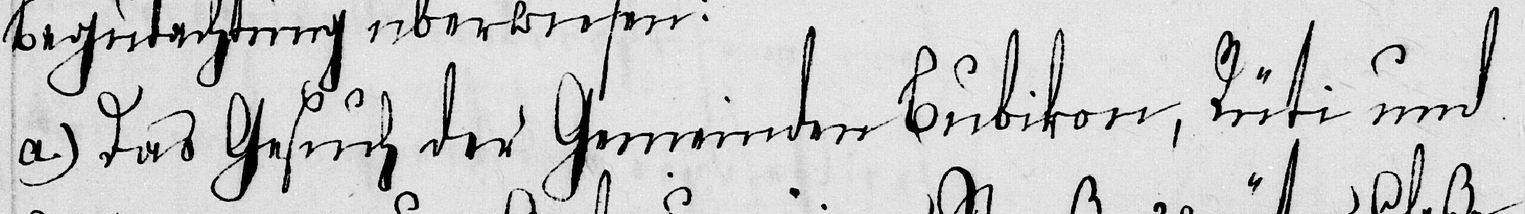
a.) Das Gesuch der Gemeinden Bubikon, Rüti und
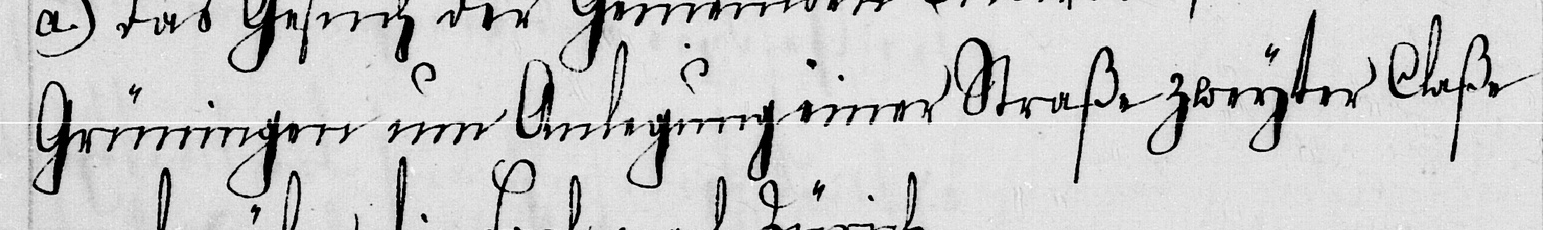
Grüningen um Anlegung einer Straße zweyter Claße
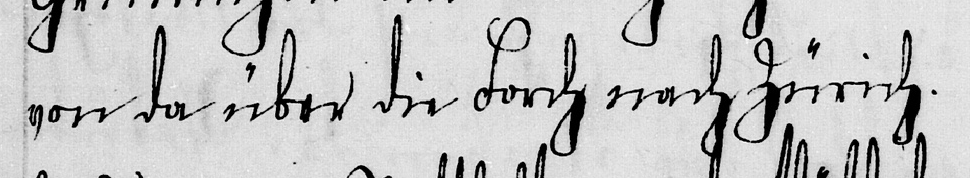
von da über die Forch nach Zürich.
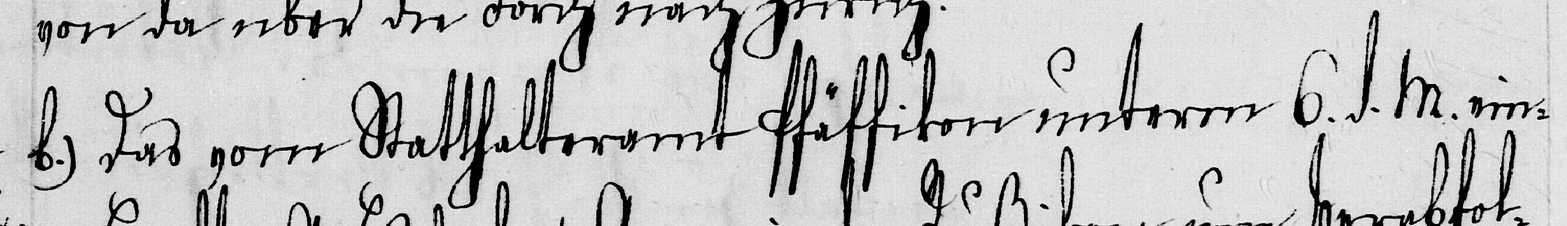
b.) Das vom Statthalteramt Pfäffikon unterm 6. d. M. ein¬
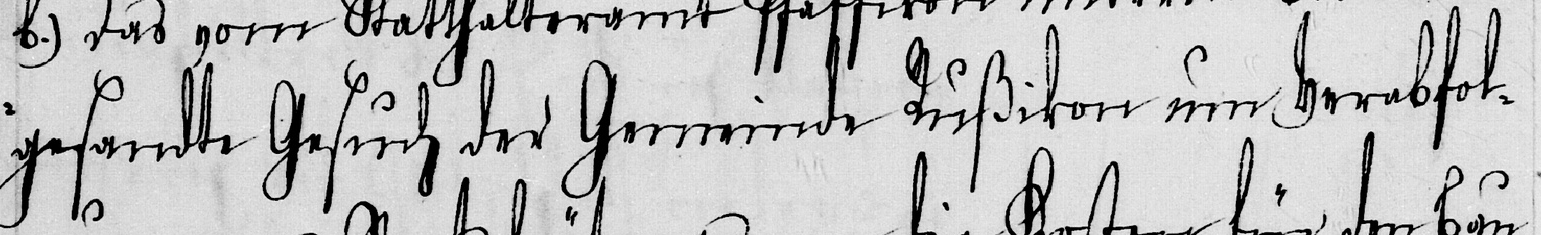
gesandte Gesuch der Gemeinde Rußikon um Verabfol¬
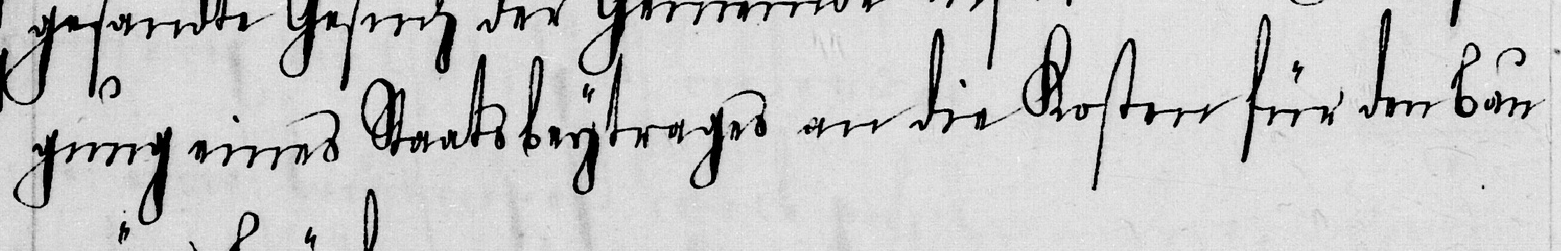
gung eines Staatsbeytrages an die Kosten für den Bau
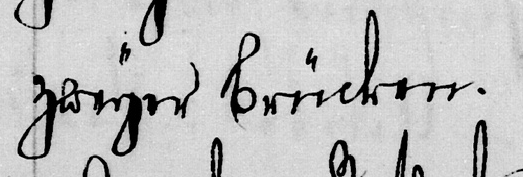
zweyer Brücken.
